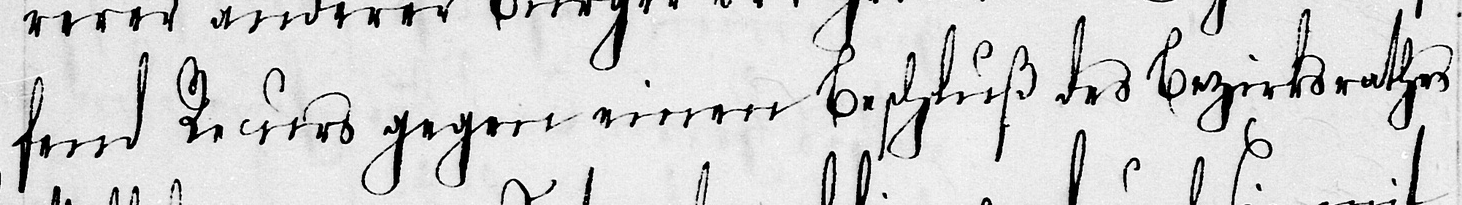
fend Recurs gegen einen Beschluß des Bezirksrathes
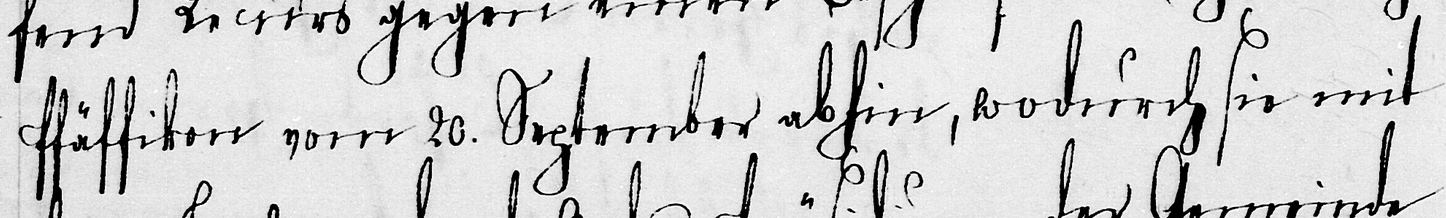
Pfäffikon vom 20. September abhin, wodurch sie mit
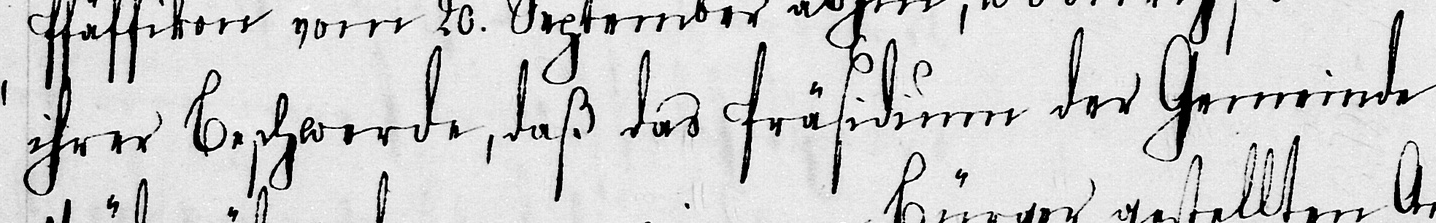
ihrer Beschwerde, daß das Präsidium der Gemeinde
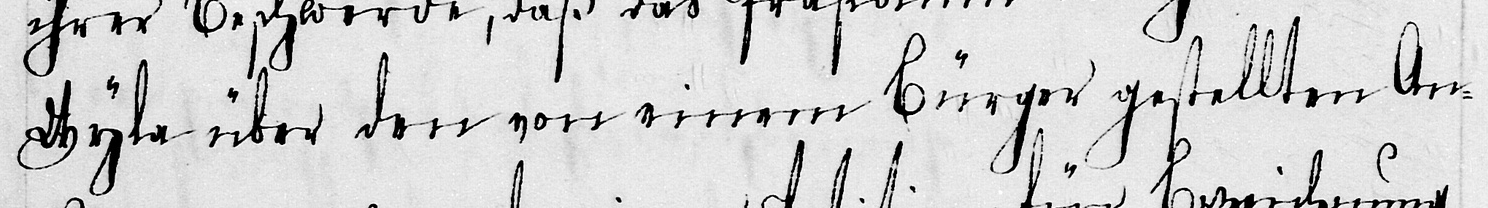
Wyla über den von einem Bürger gestellten An¬
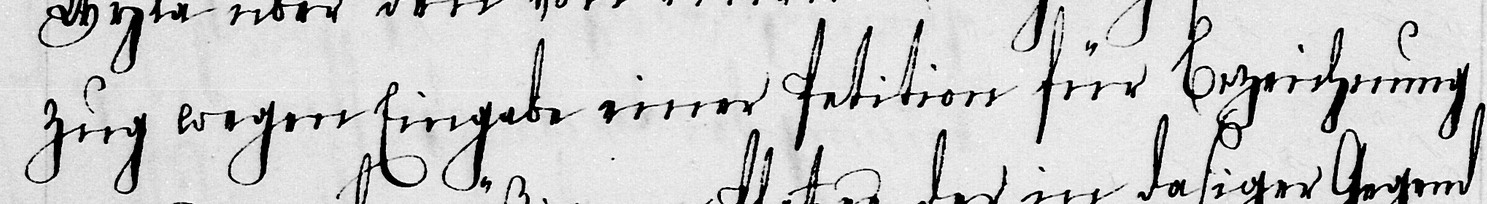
zug wegen Eingabe einer Petition für Bezeichnung
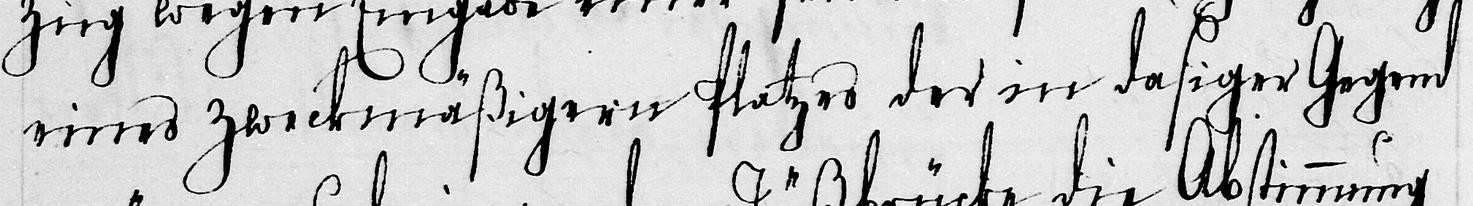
eines zweckmäßigern Platzes der in dasiger Gegend
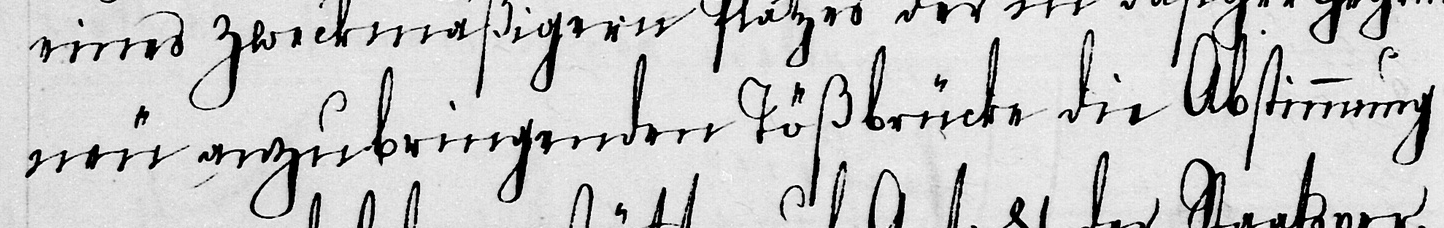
neu anzubringenden Tößbrücke die Abstimmung
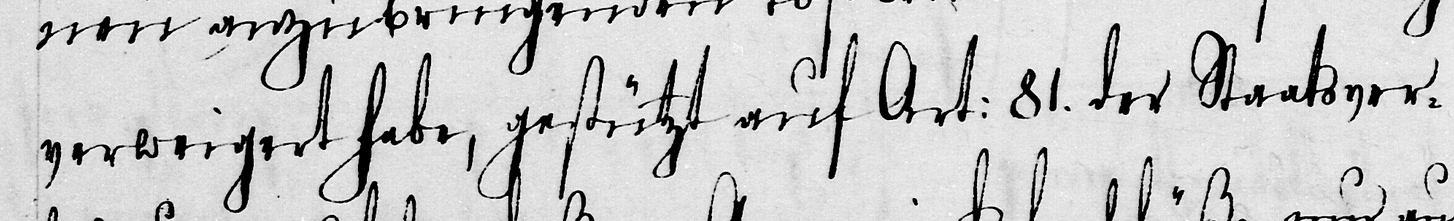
verweigert habe, gestützt auf Art: 81. der Staatsver¬
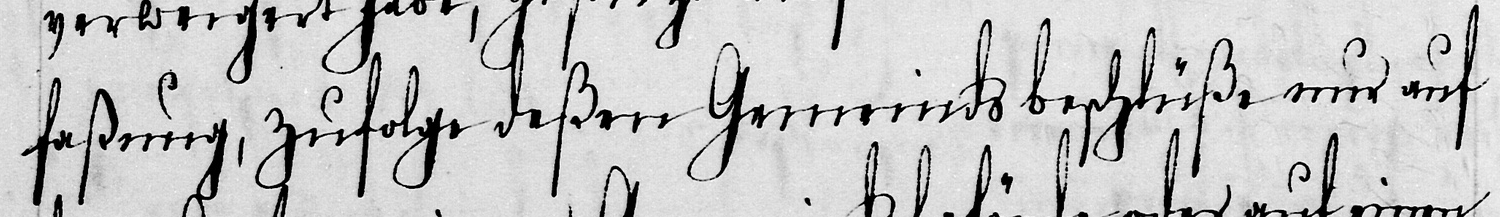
faßung, zufolge deßen Gemeindsbeschlüße nur auf
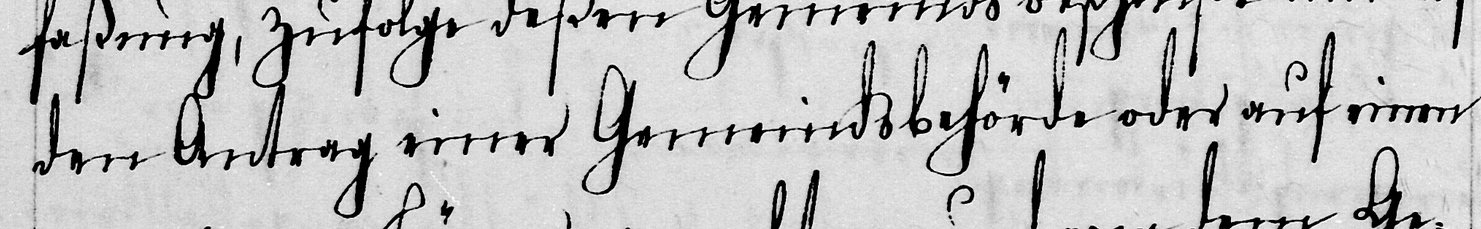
den Antrag einer Gemeindsbehörde oder auf einen
